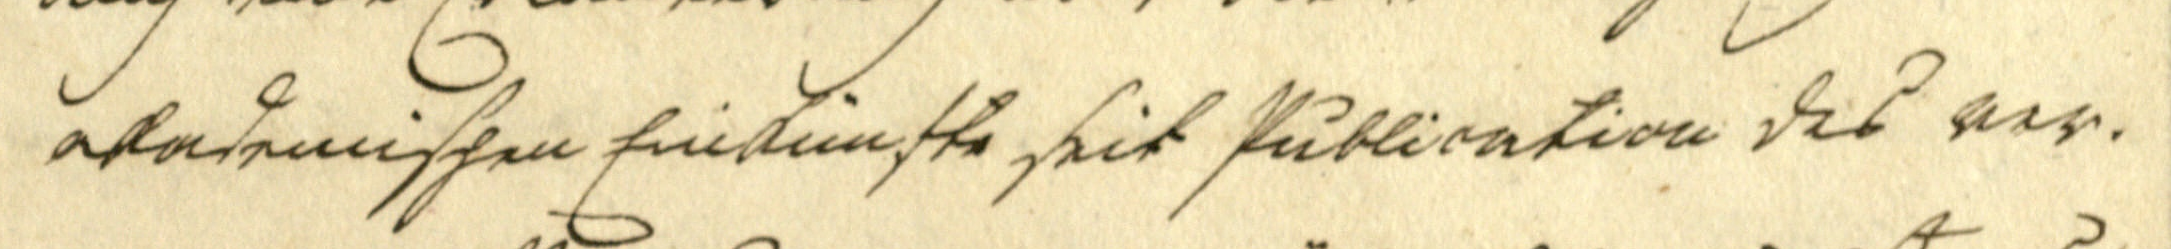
akademischen Einkünfte seit Publication des ver¬
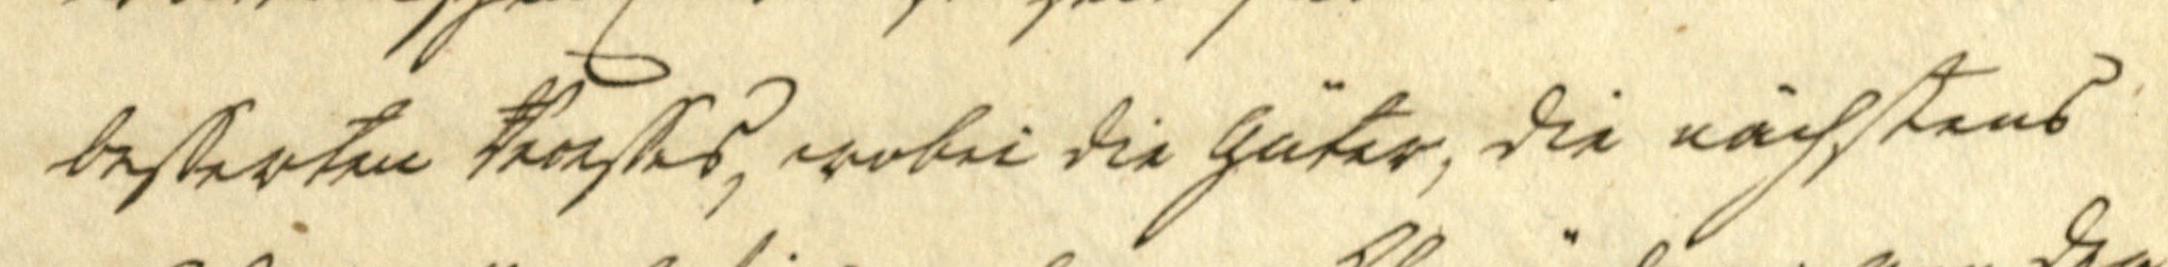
besserten Recesses, wobei die Güter, die nächstens
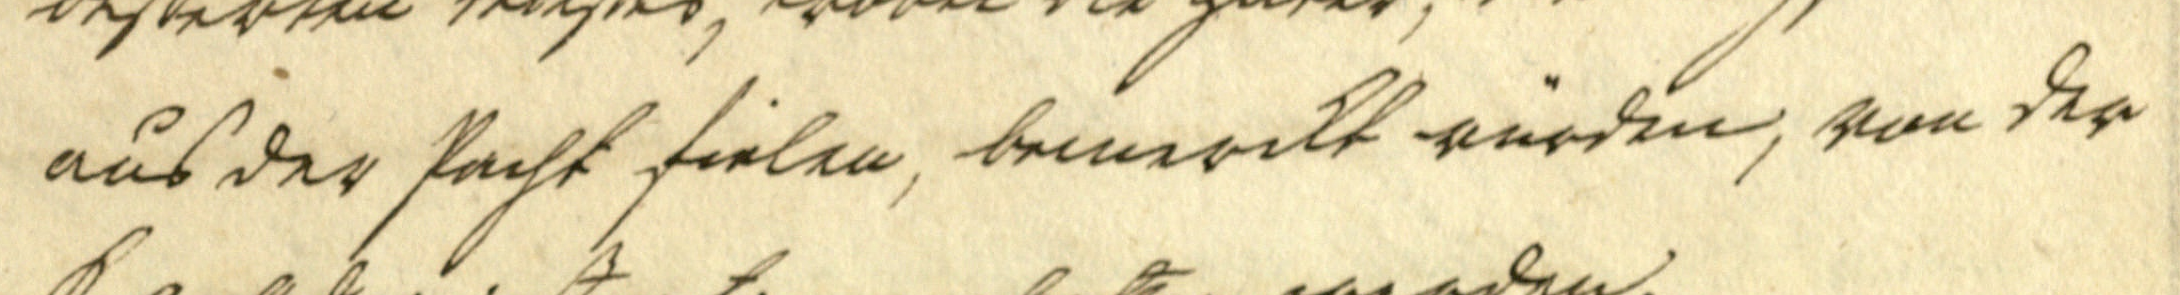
aus der Pacht fielen, bemerckt würden, von der
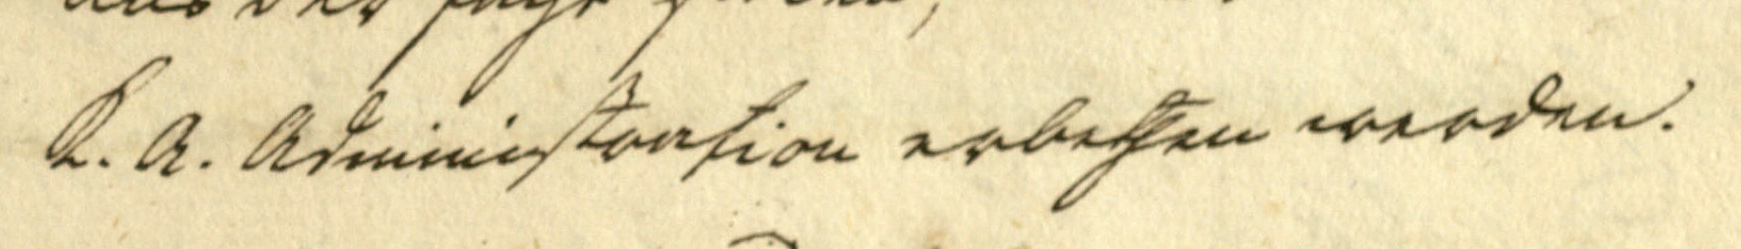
K. A. Administration erbethen werden.
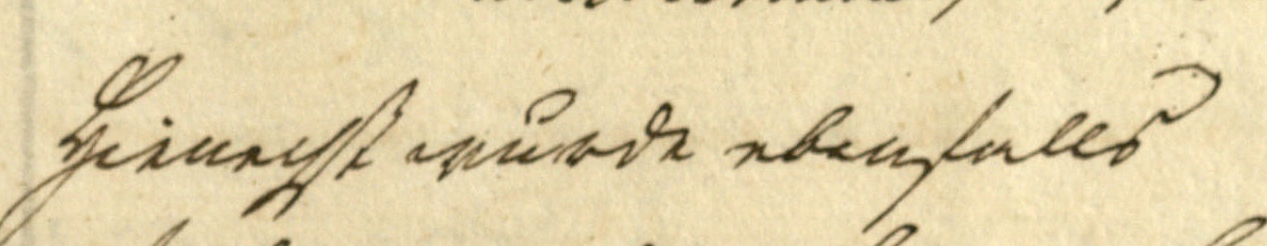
Hienechst würde ebenfalls
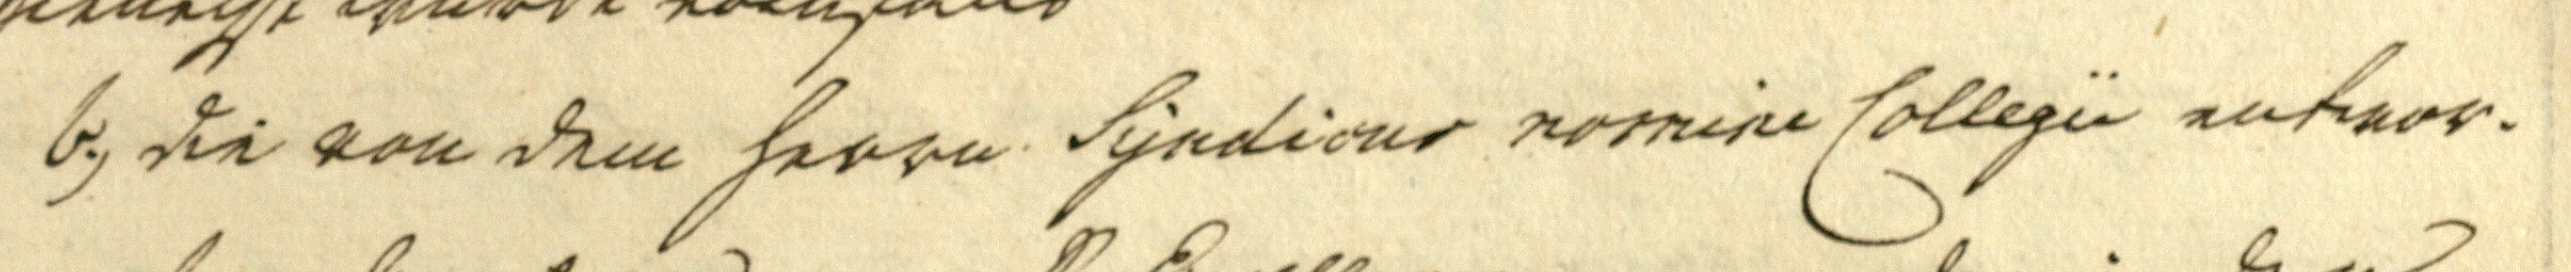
b., die von dem Herrn Sÿndicus nomine Collegii entwor¬
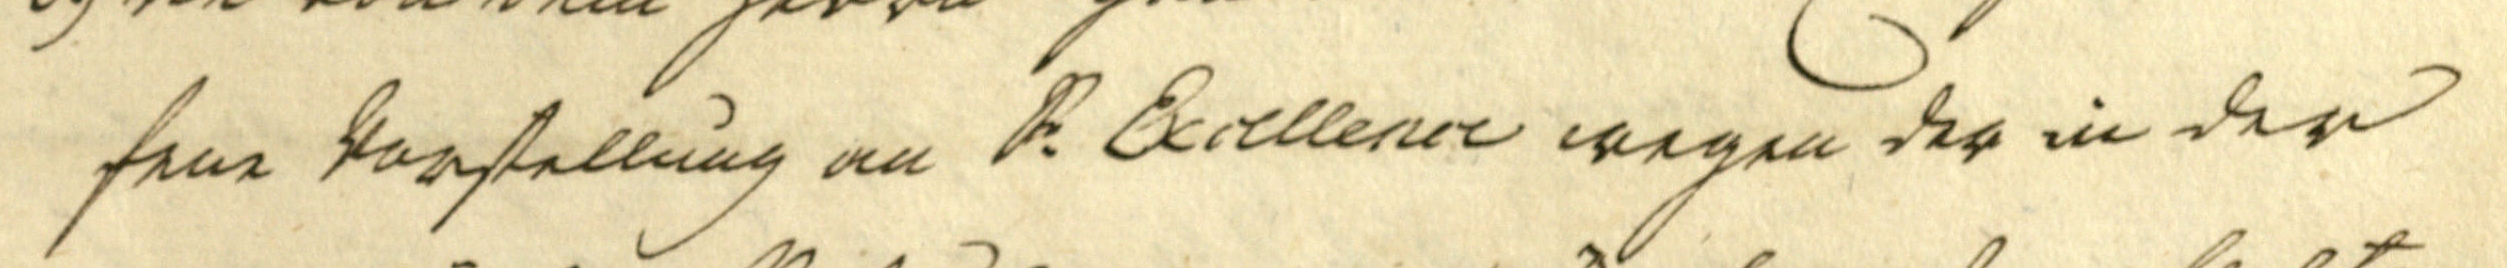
fene Vorstellung an Sr. Excellence wegen der in der
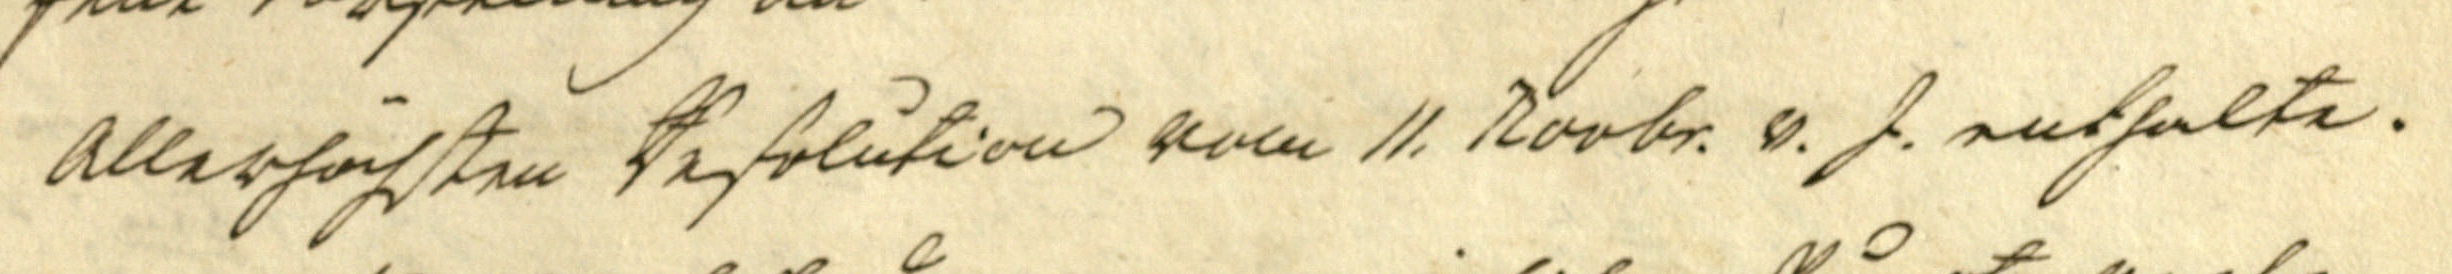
Allerhöchsten Resolution vom 11. Novbr. v. J. enthalte¬
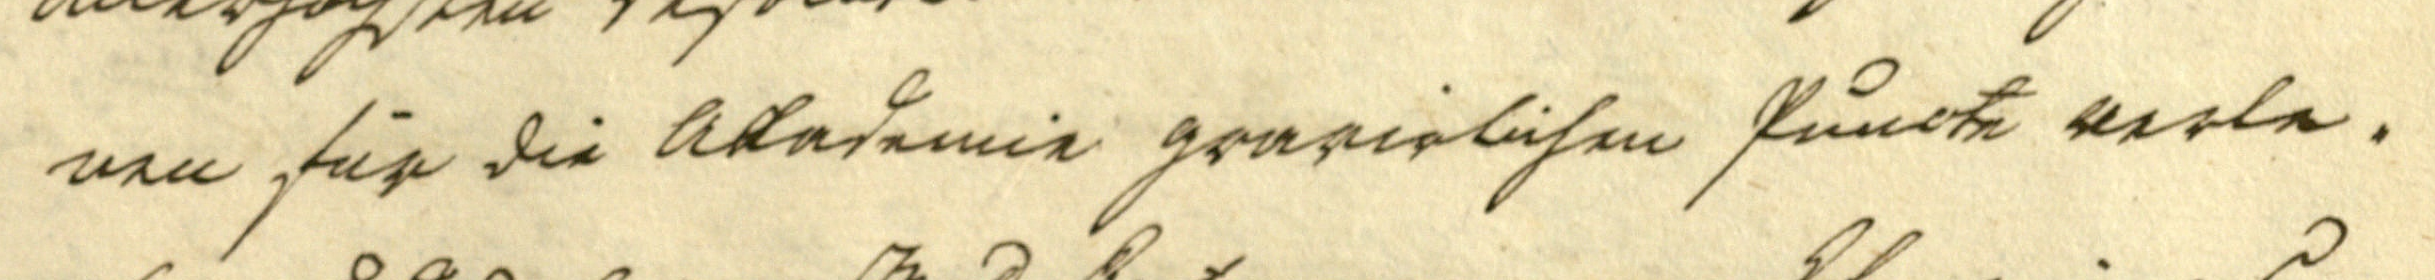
nen für die Akademie gravirlichen Puncte verle¬
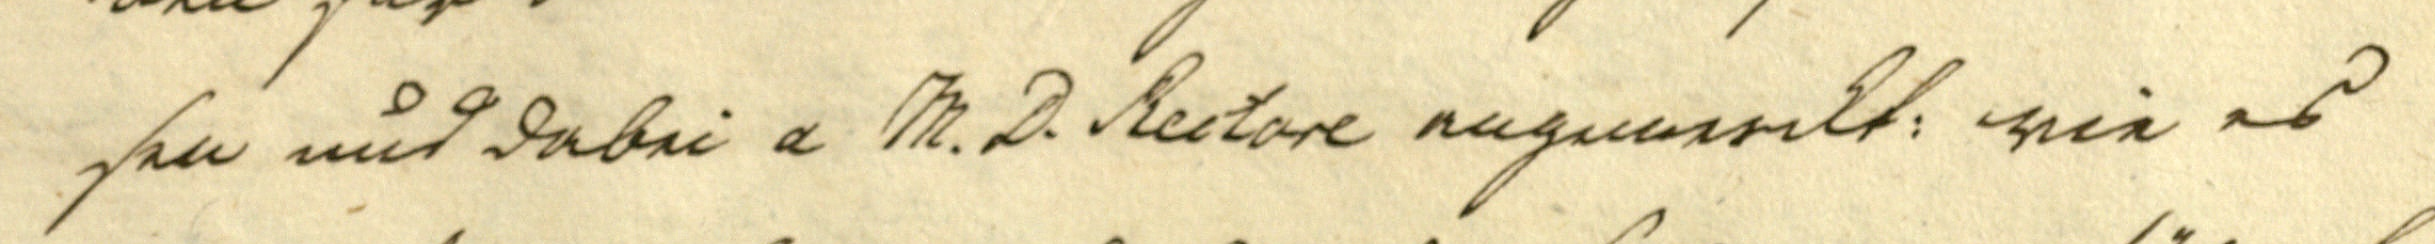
sen und dabei a M. D. Rectore angemerckt: wie es
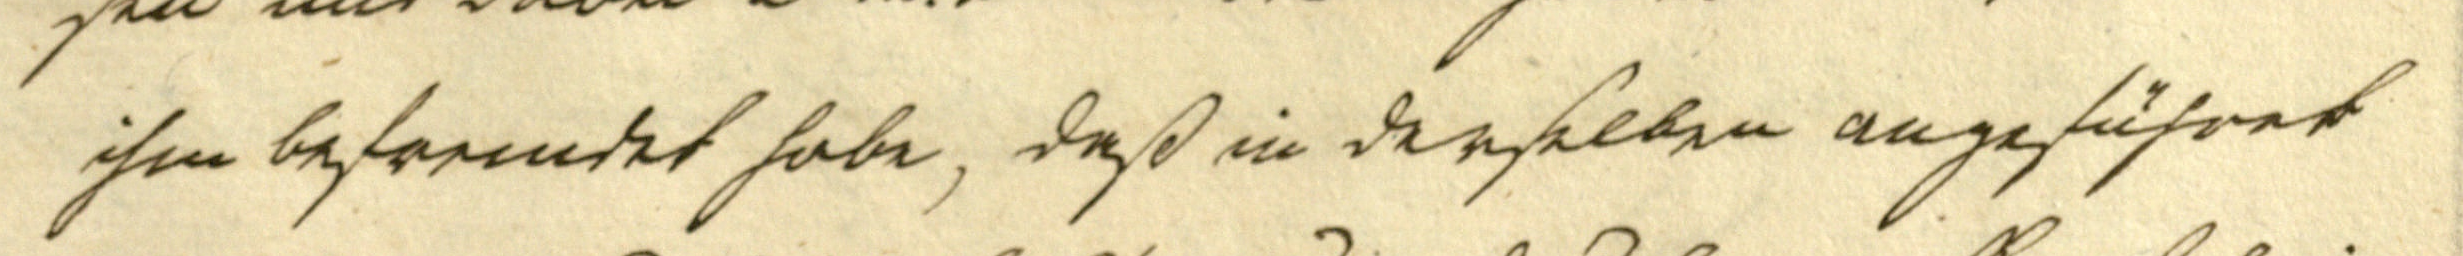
ihm befremdet habe, daß in derselben angeführet
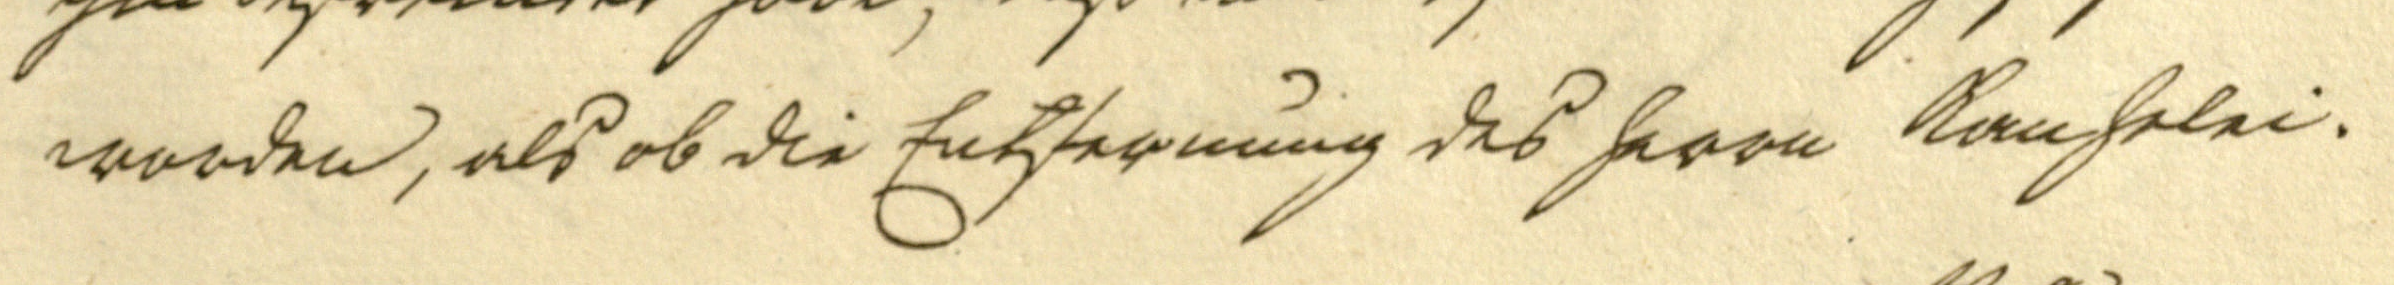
worden, als ob die Entfernung des Herrn Kanzelei¬
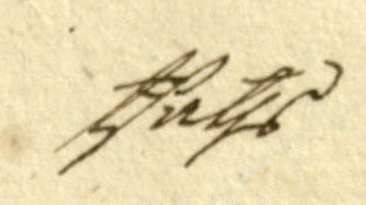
Raths
